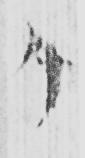千
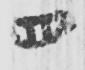四
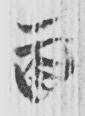百
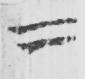二
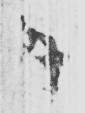千
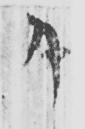千
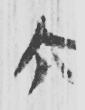六
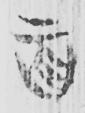百
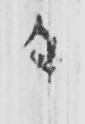千
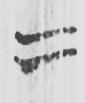二
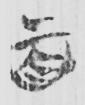百
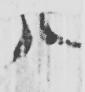八
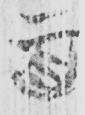百
